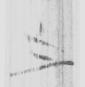之
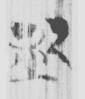卹
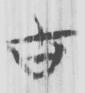古
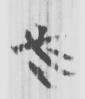必
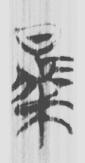{日朿}
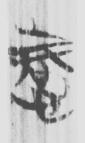𢝬
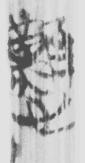戁
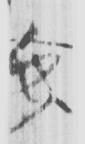安
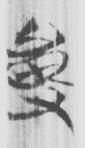尃
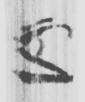正
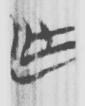戶
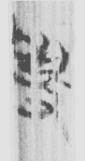事
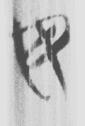母
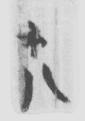{十八}
